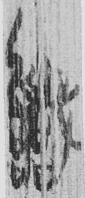{囂戈}（傲）
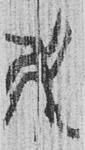民
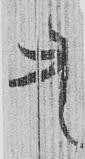又（有）
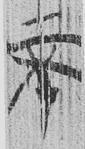不
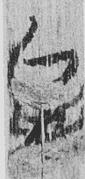能
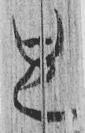也
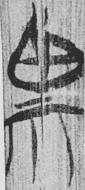○（鬼）
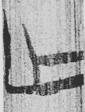亡
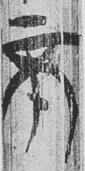不
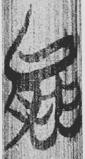能
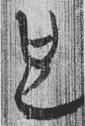也
